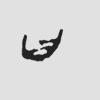曰
